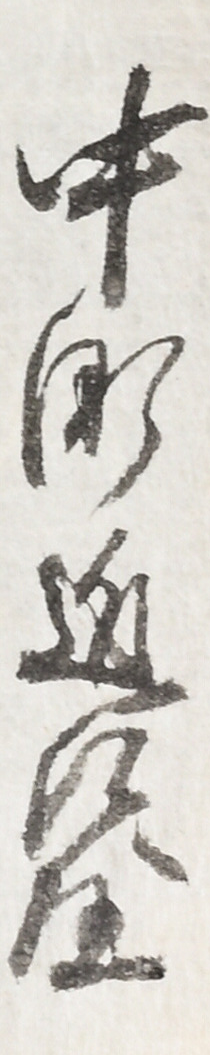中町近江屋
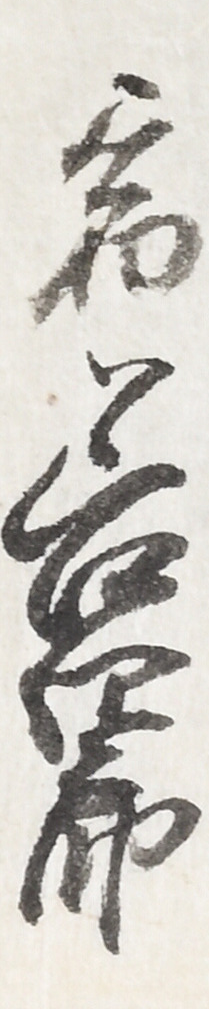宿善四郎
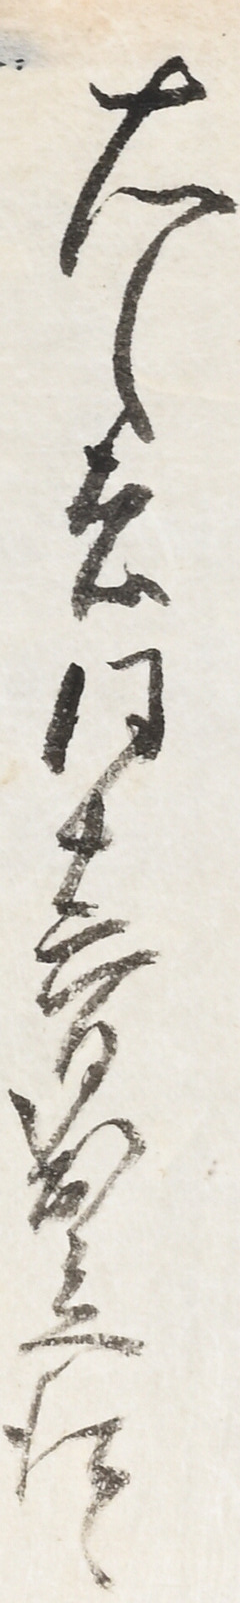右之者同十六日出立仕候
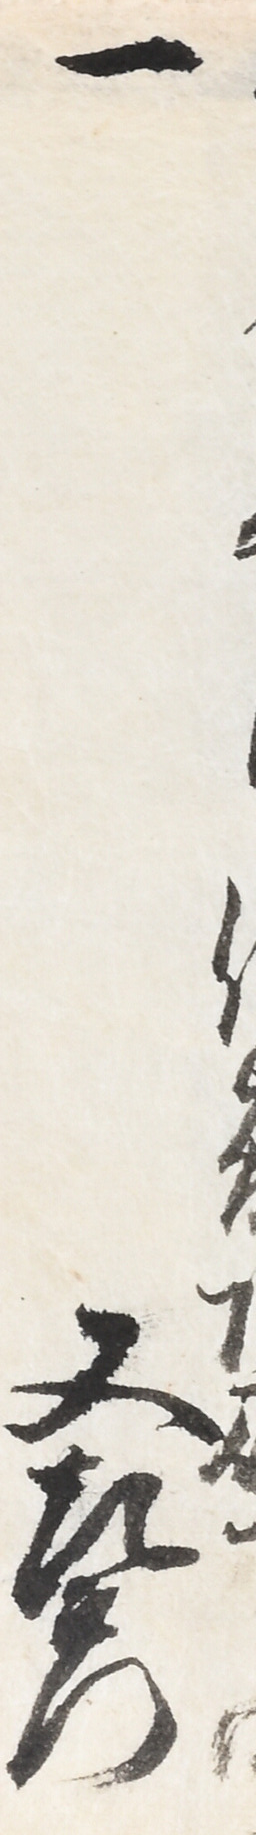一又左衛門
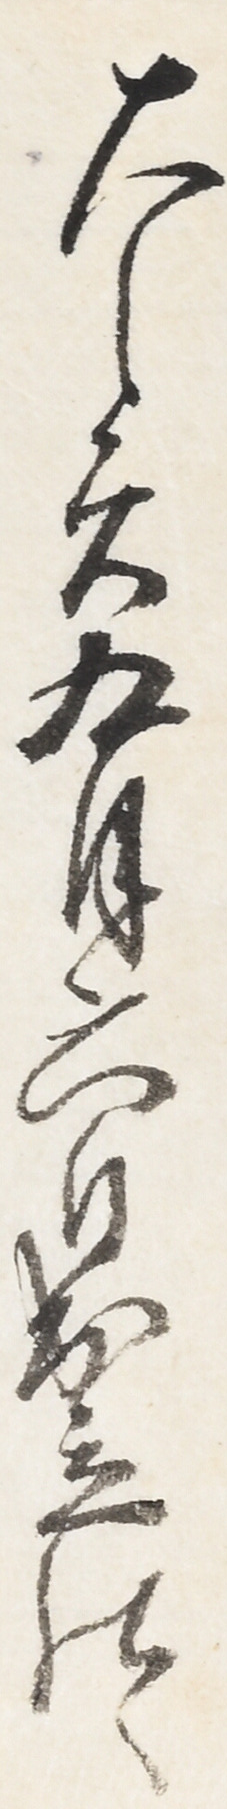右之者九月六日出立仕候
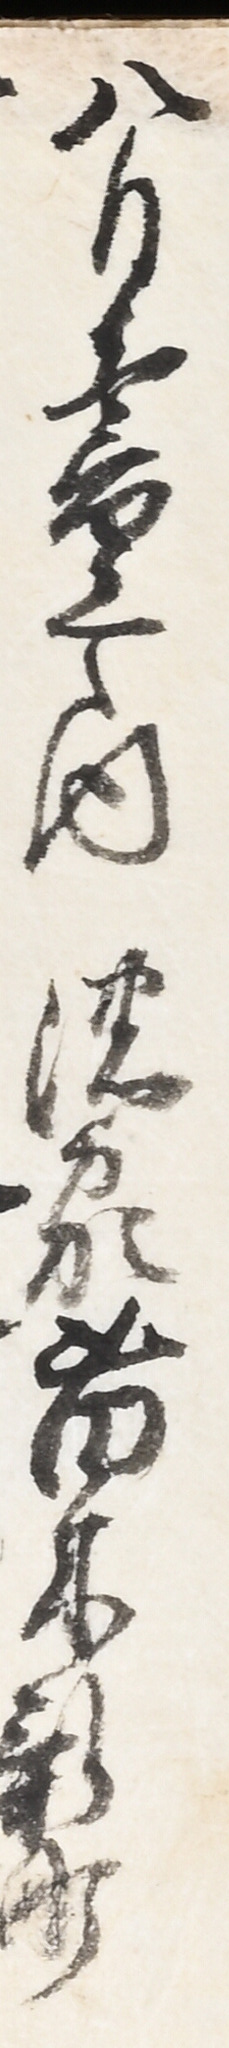八月書上之内濃州苗木新町
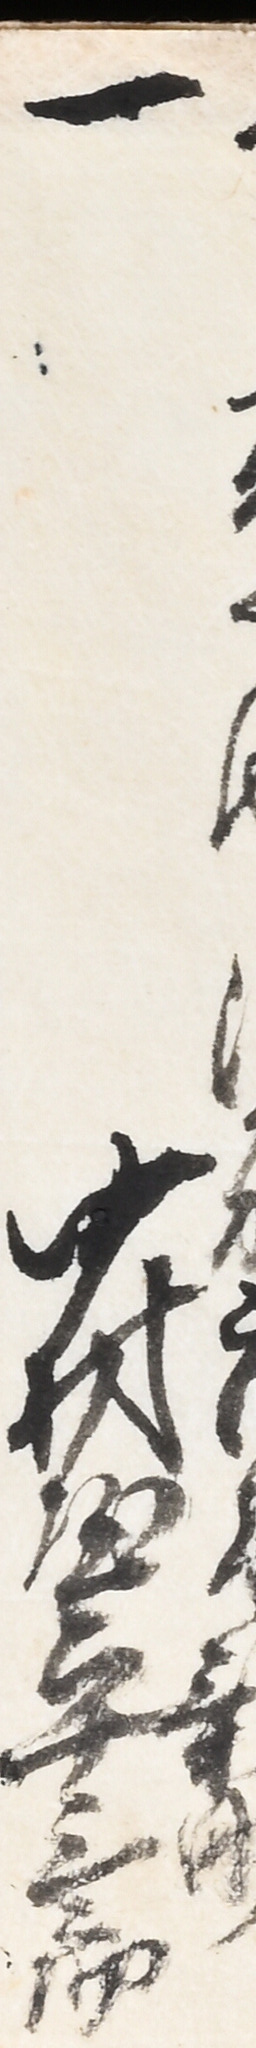一中村屋平三郎
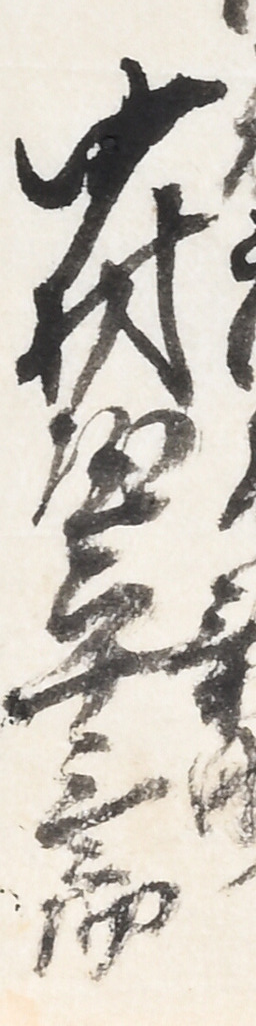一中村屋平三郎
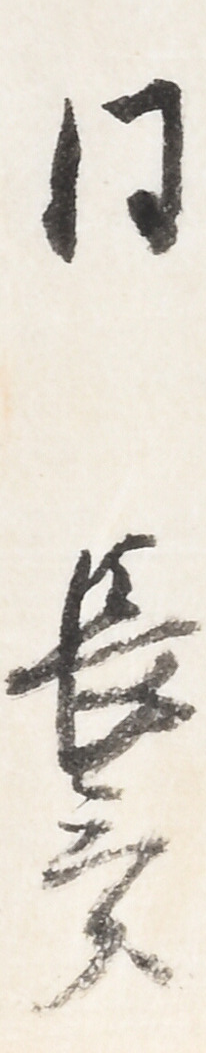同長三郎
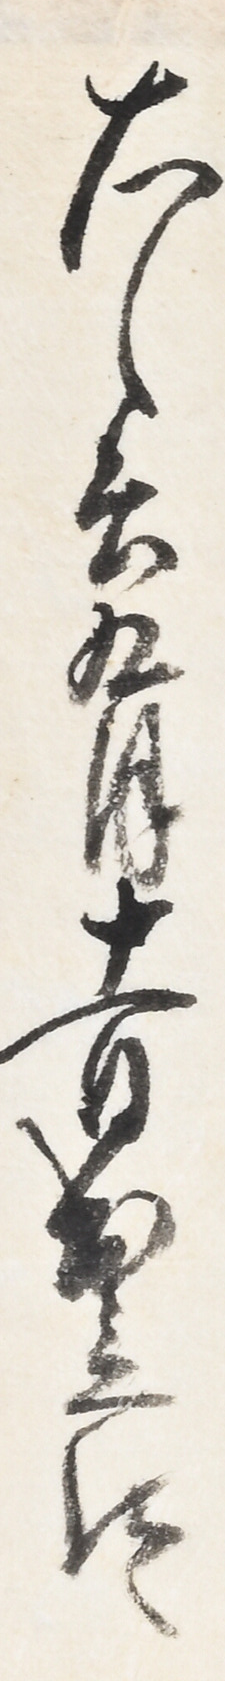右之者九月十一日出立仕候
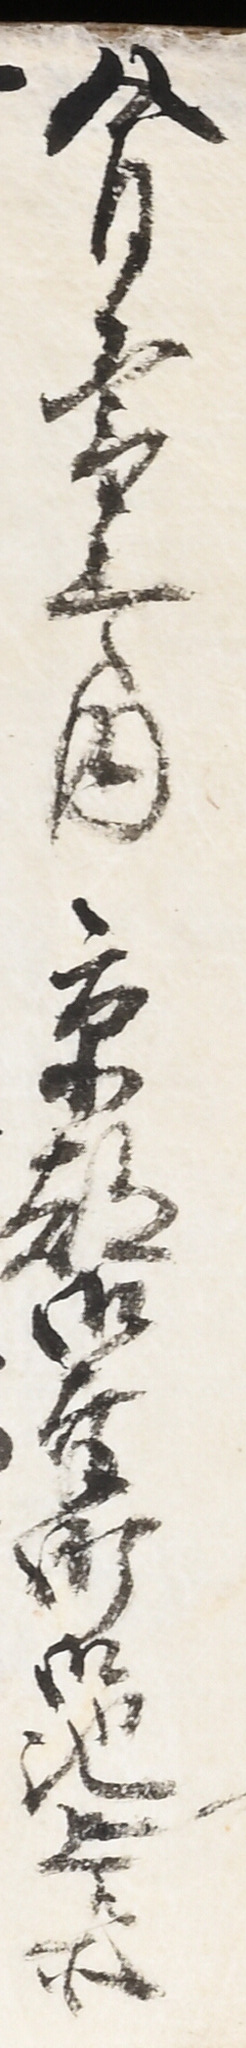八月書上之内京都御幸町御池上ル所
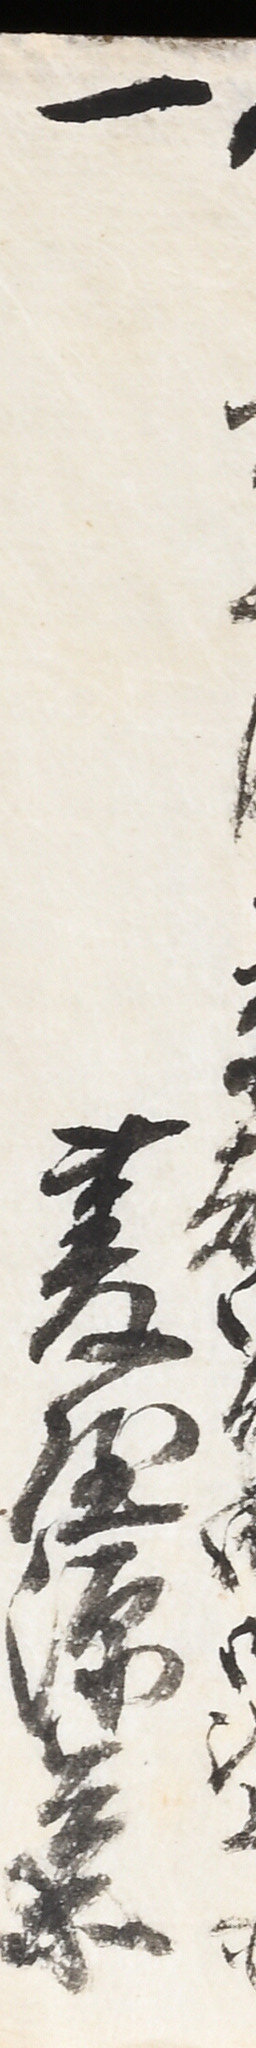一菱屋源兵衛
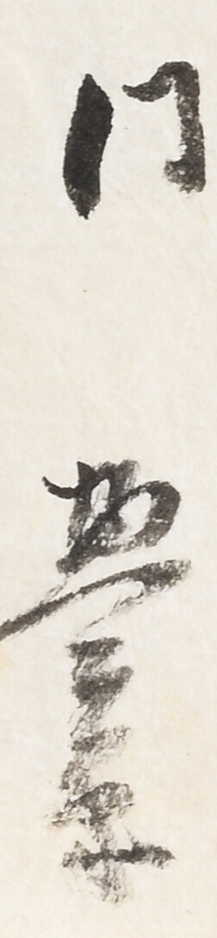同惣兵衛
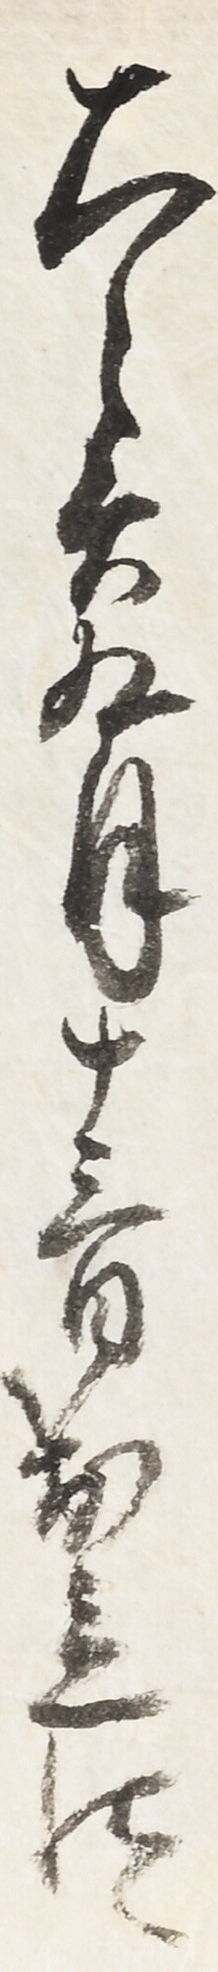右之者九月十三日出立仕候
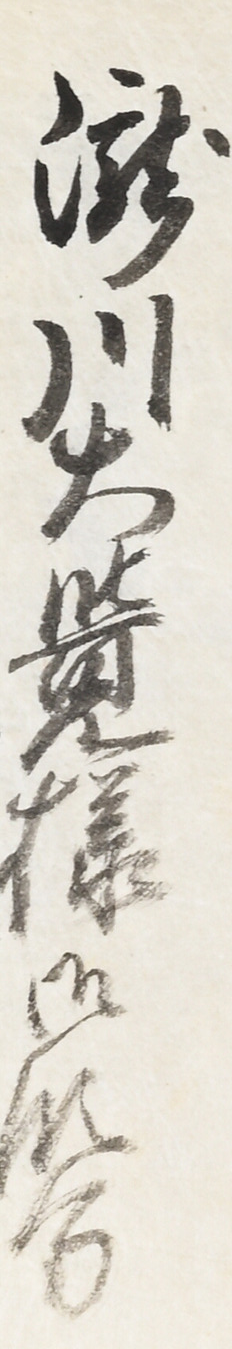瀧川大学様御領分
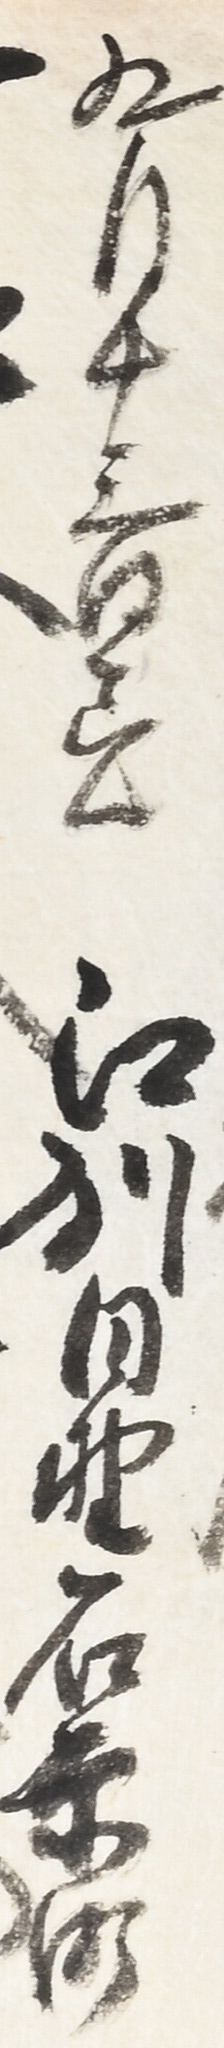九月十三日着江州日野石原町
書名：旅人泊控帳
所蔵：伊那市立高遠町図書館・合同会社AMANE
